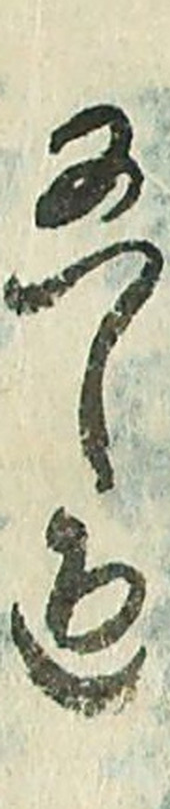右之通
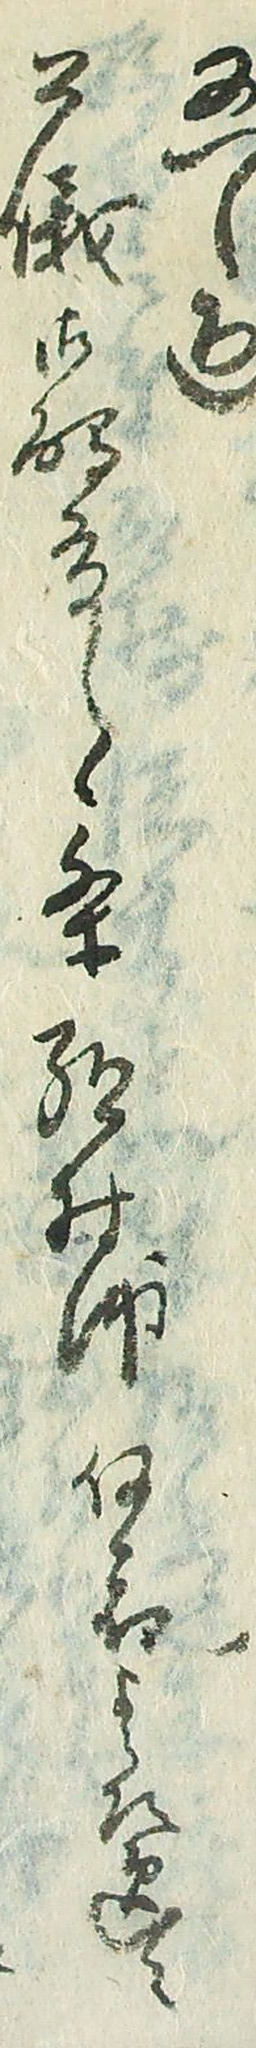公儀御触有之候条組村浦何者よらす逸々
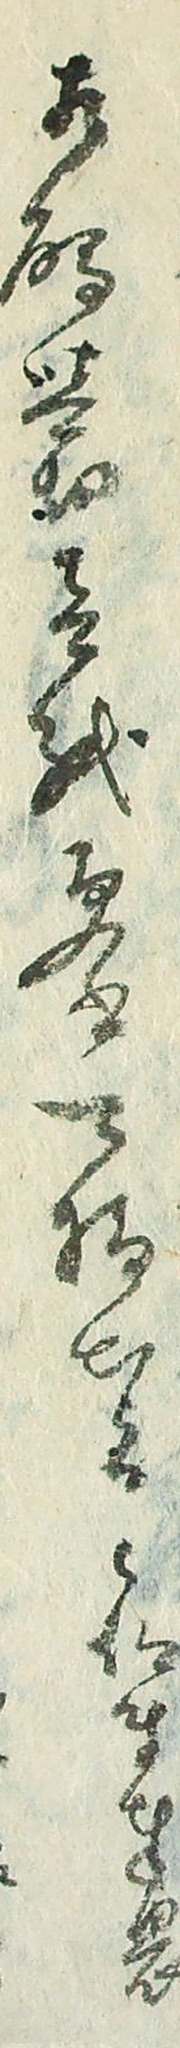相触与切壱紙受書可指出旨被仰付奉畏
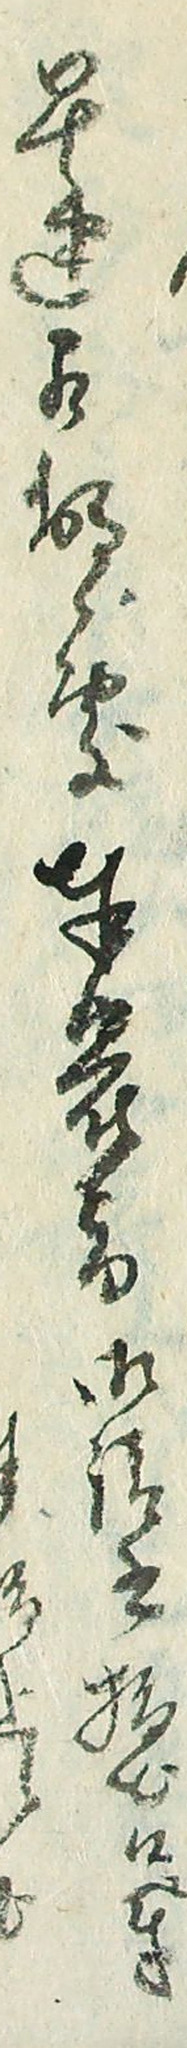早速相触候処奉畏旨御請書指出候に付
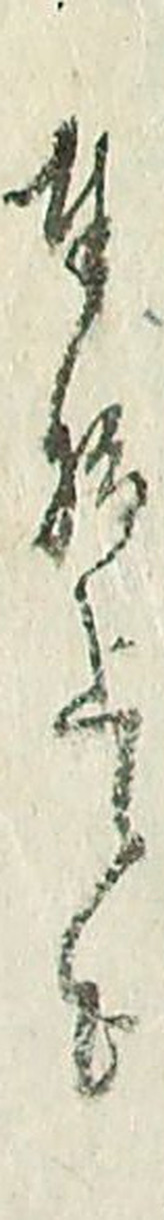奉指上候以上

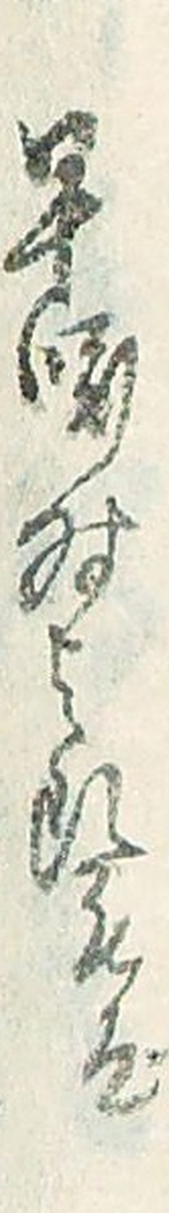早淵村与頭庄屋
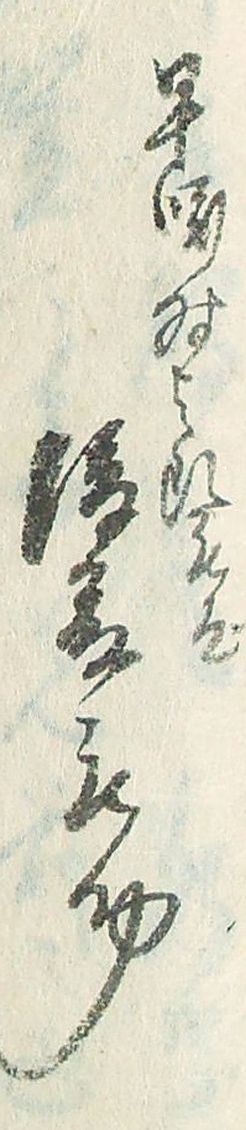後藤庄助
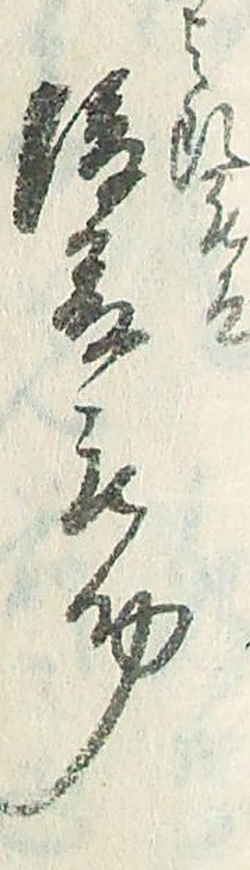後藤庄助
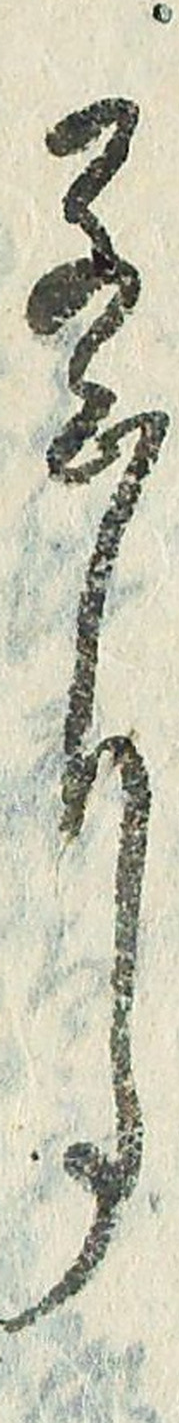子正月
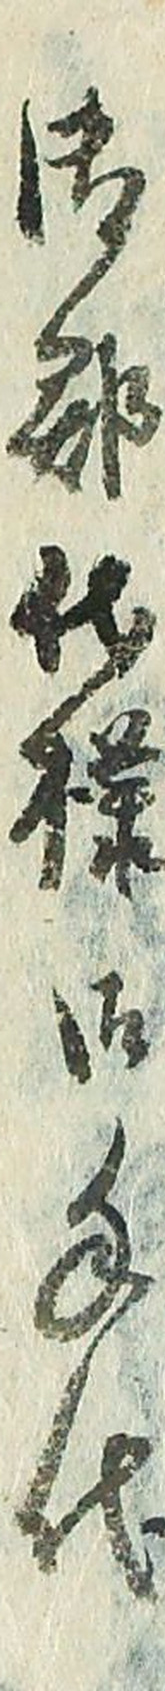御郡代様御手代
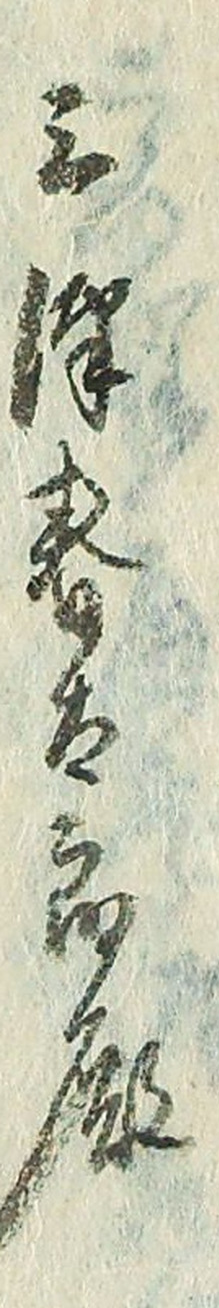三沢春太郎殿
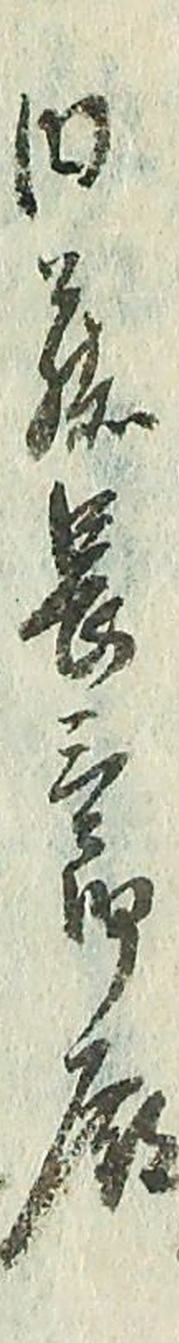内藤長三郎殿
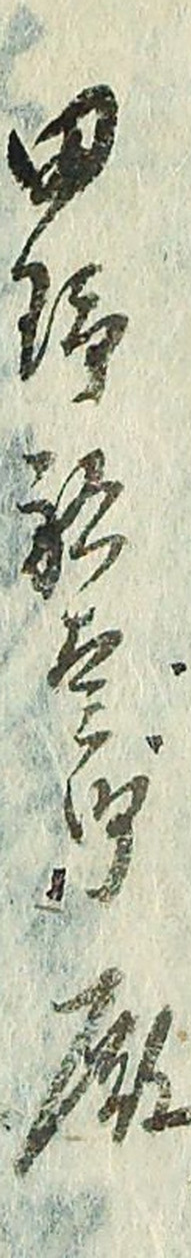田野祐太郎殿
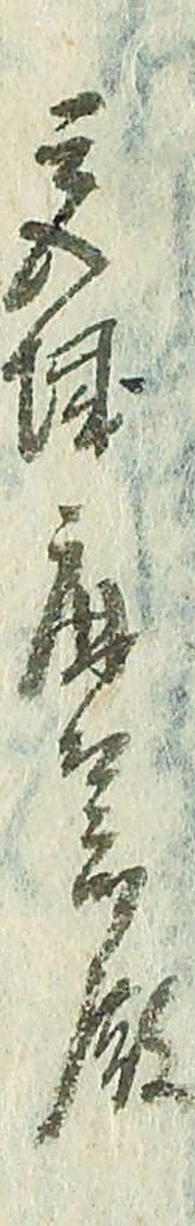宮城麻太郎殿
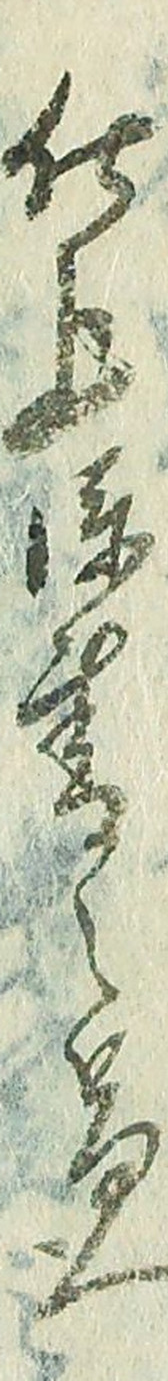仕上添書之覚
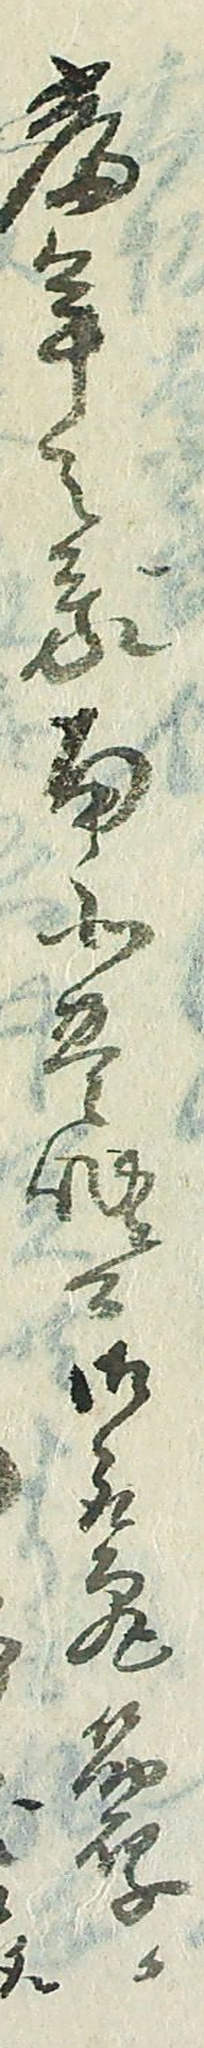当年之義南北豊作に而御取究筋厚く
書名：諸御用御□受書控
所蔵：鳴門教育大学 Naruto University of Education
